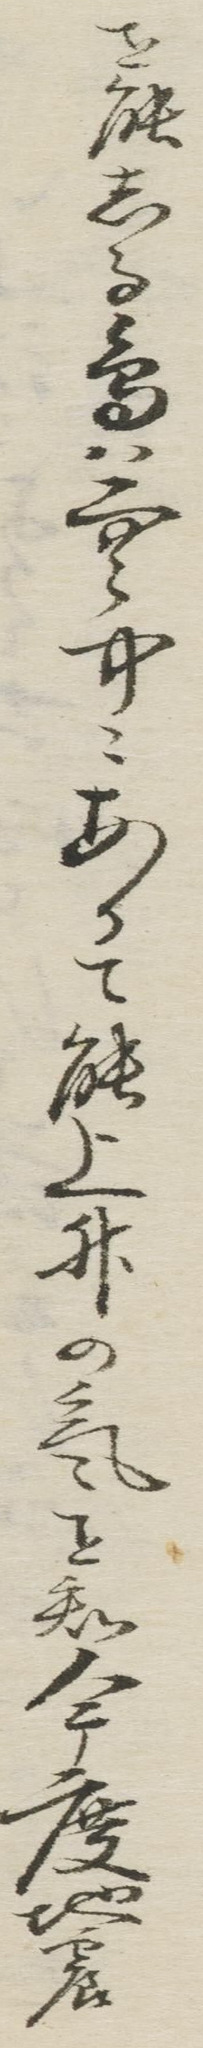を能しる鳥ハ空中ニありて能上升の気を知今度地震
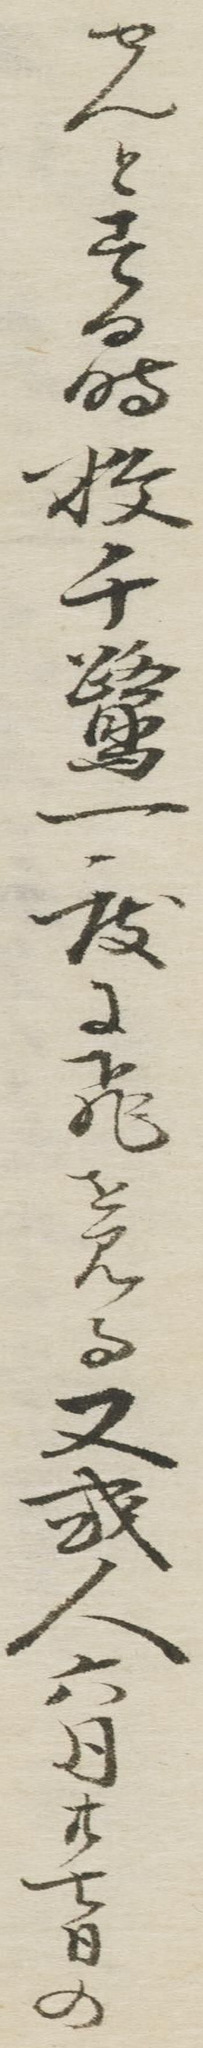セんとする時数千鷺一度に飛を見る又或人六月廿七日の
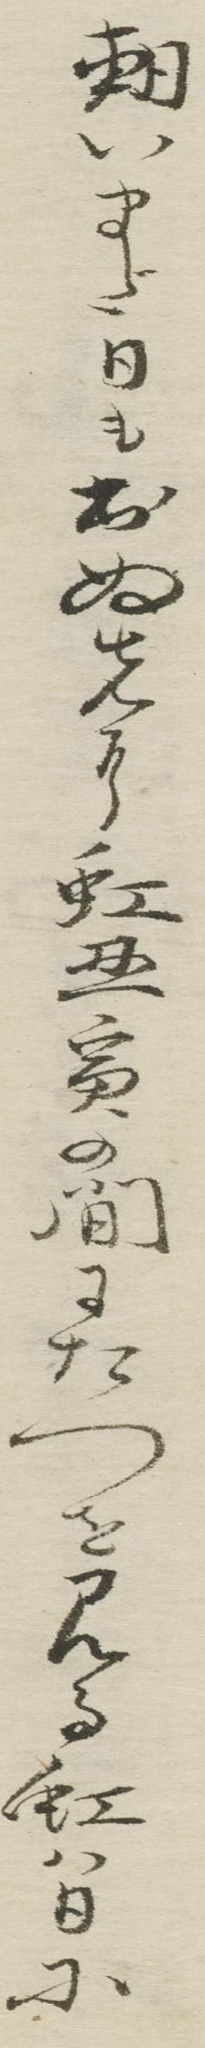朝いまだ日も出ぬ先に虹丑寅の間にたつを見る虹ハ日に

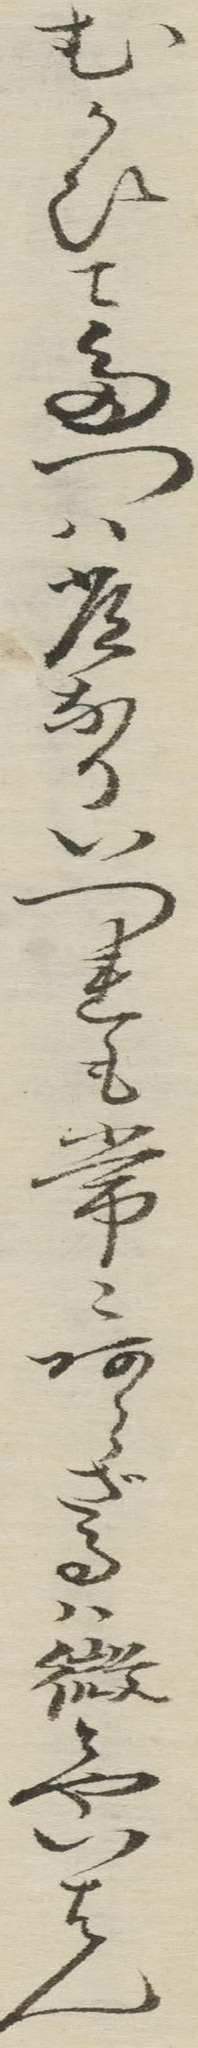むかひてたつハ常なりいつれも常ニあらざるハ微とやいはん
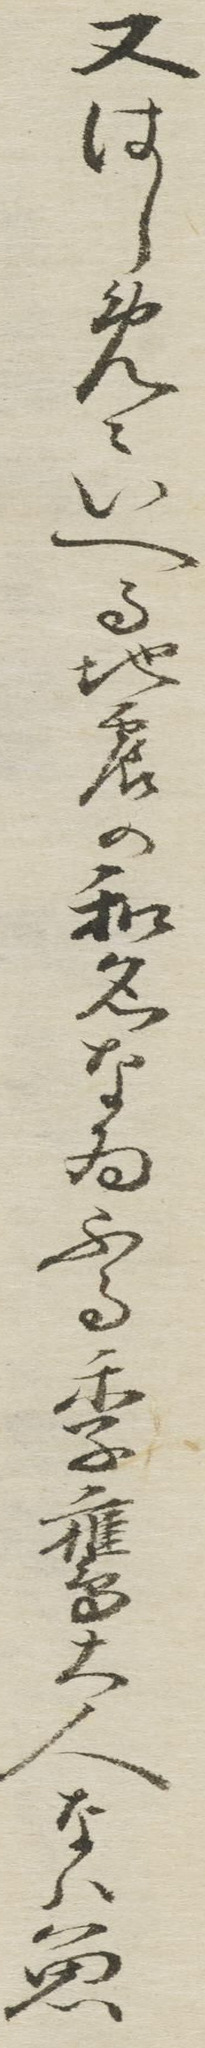又はじめニいへる地震の和名なゐふる季鷹大人なハ魚
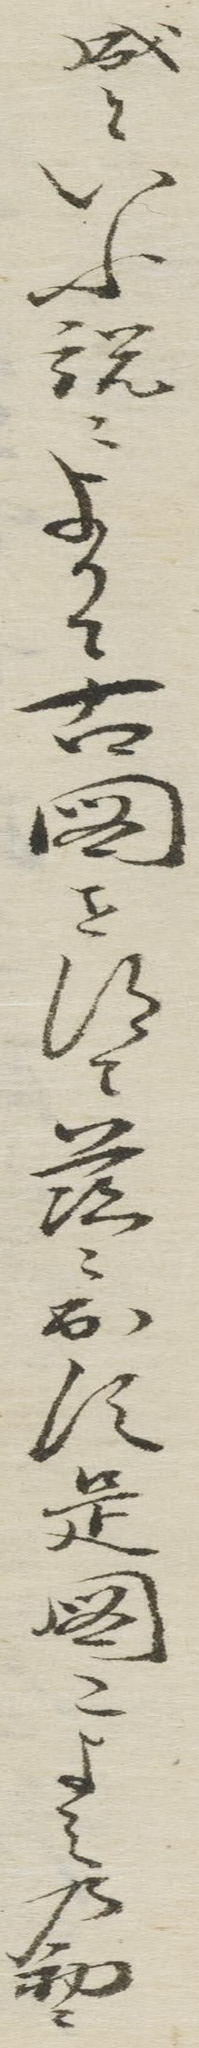成といふ説二よりて古図を得て茲ニ出す是図こよミの初ニ
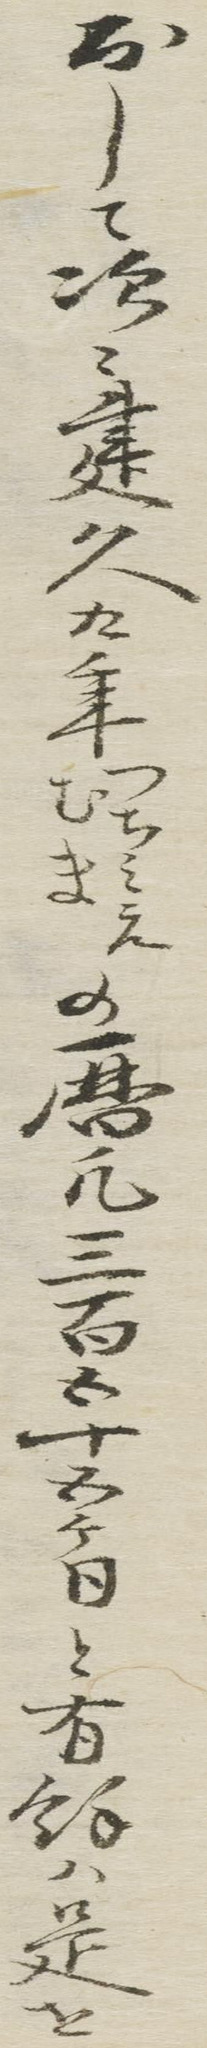出して次ニ建久九年つち之えむまの暦凡三百五十五ケ日と有余ハ是を
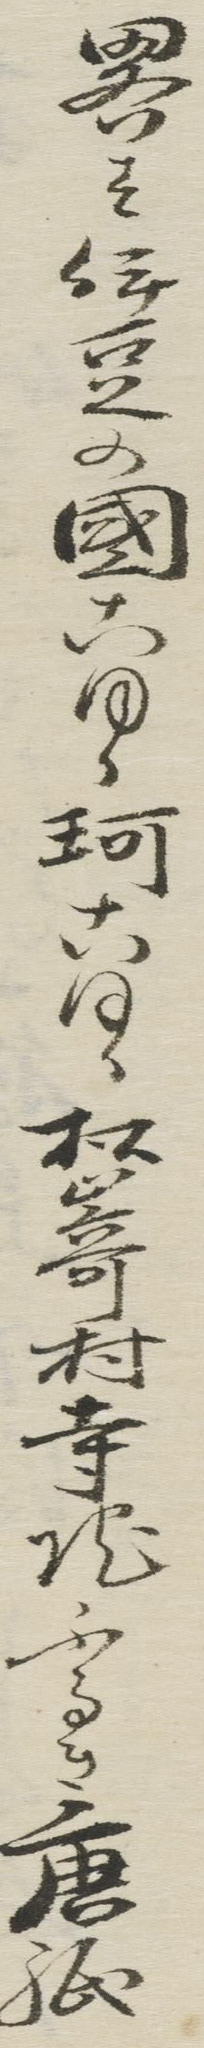略す伊豆の国こゆり珂古ゆり杉崎村寺地ふるき唐紙
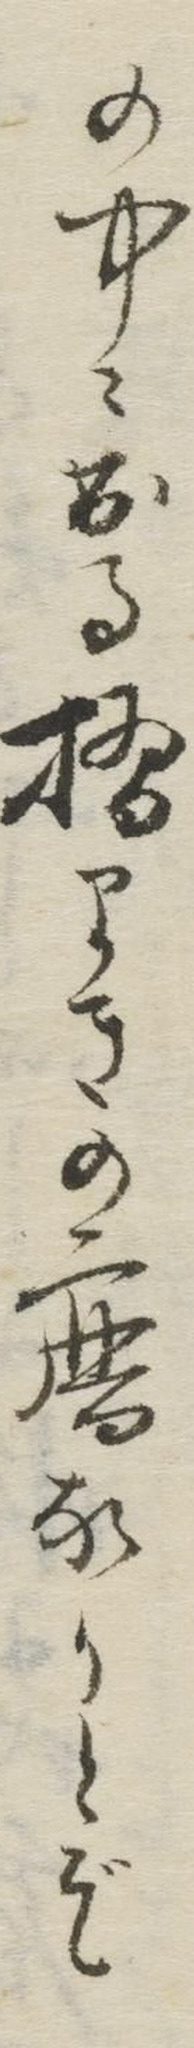の中ニ出る摺まきの磨なりとぞ
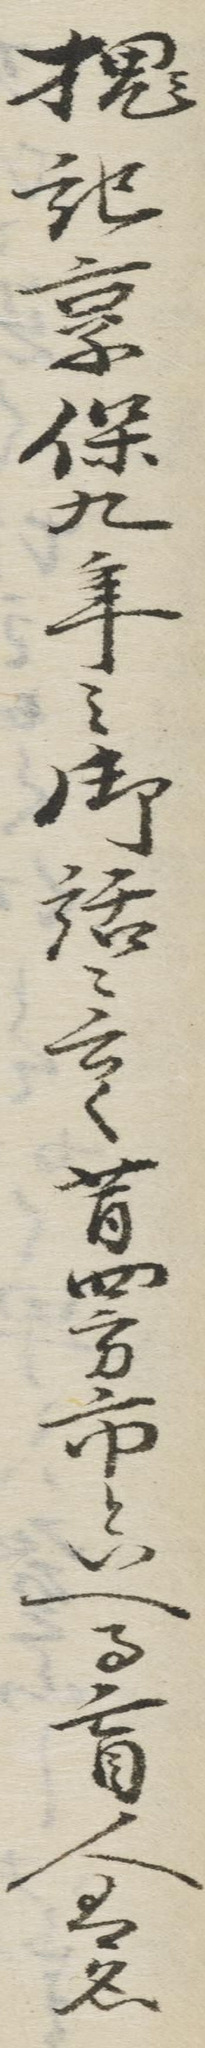蒐記享保九年之御話ニ言く昔四方市といへる盲人は名
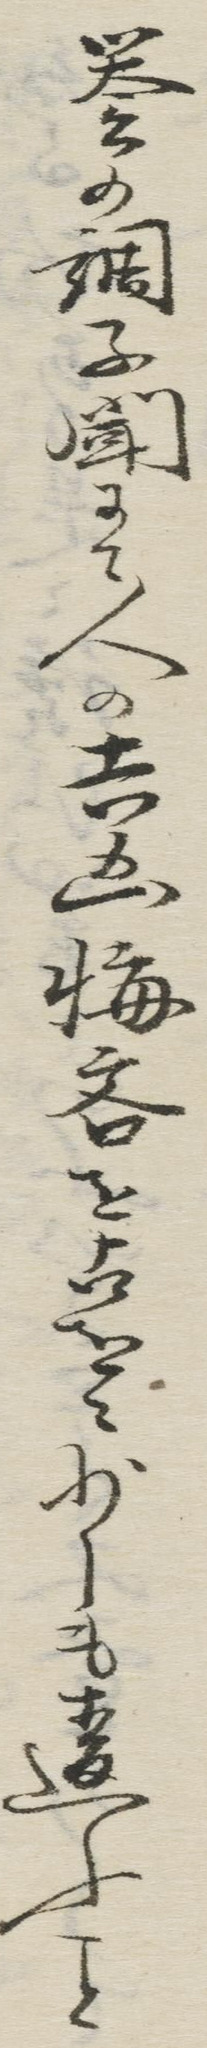誉の調子聞にて人の吉凶悔吝を占フニ少しも違ふこと
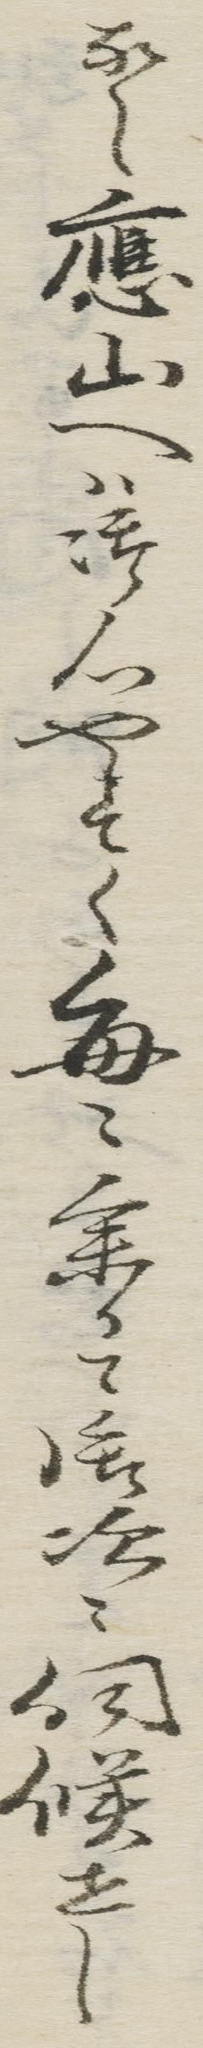なし応山ヘハ御心やすく毎々参りて御次々伺候をし
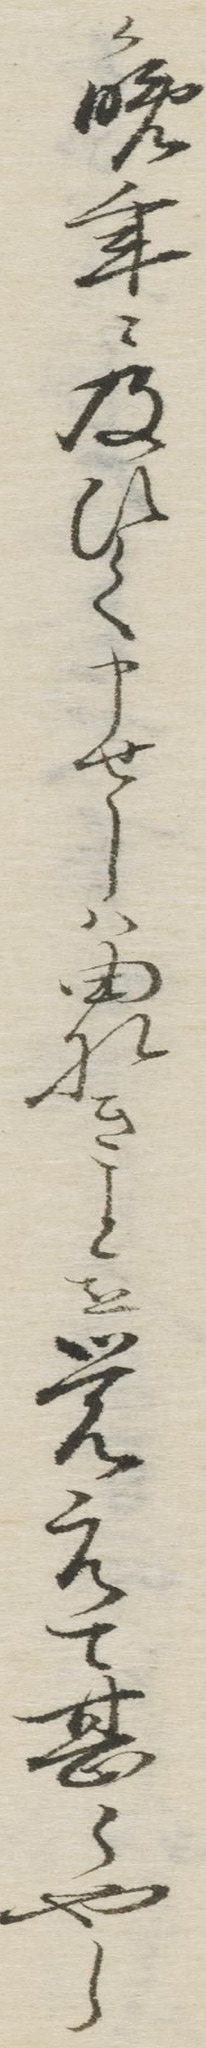而晩年ニ及ひて申せしハ由なきことを覚えて甚くやし
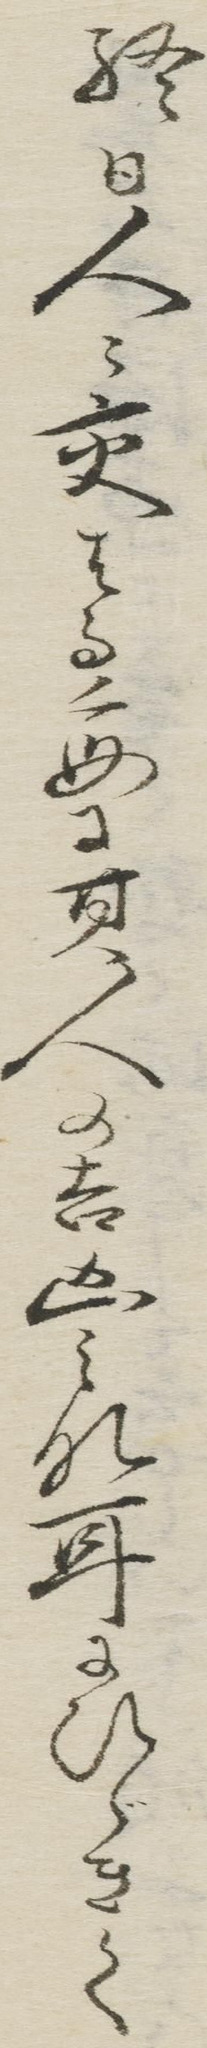終日人ニ交する毎に其人の吉凶ミな耳にひゞきて
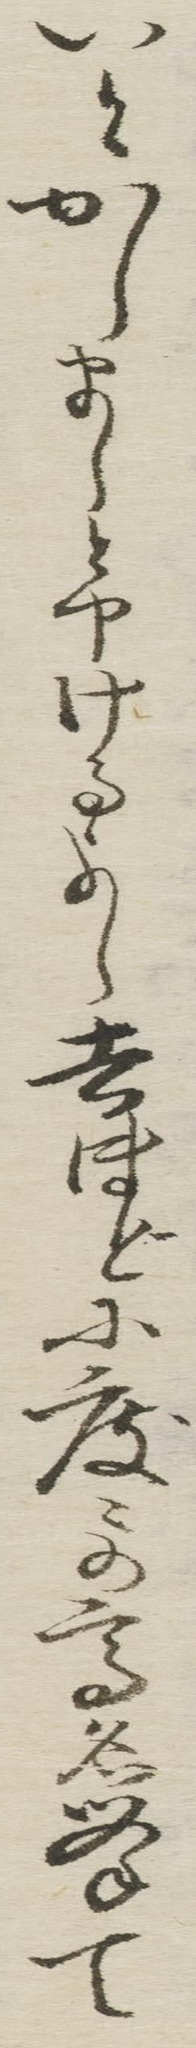いとかしましと申けるよし去ほどに度々の高名挙て
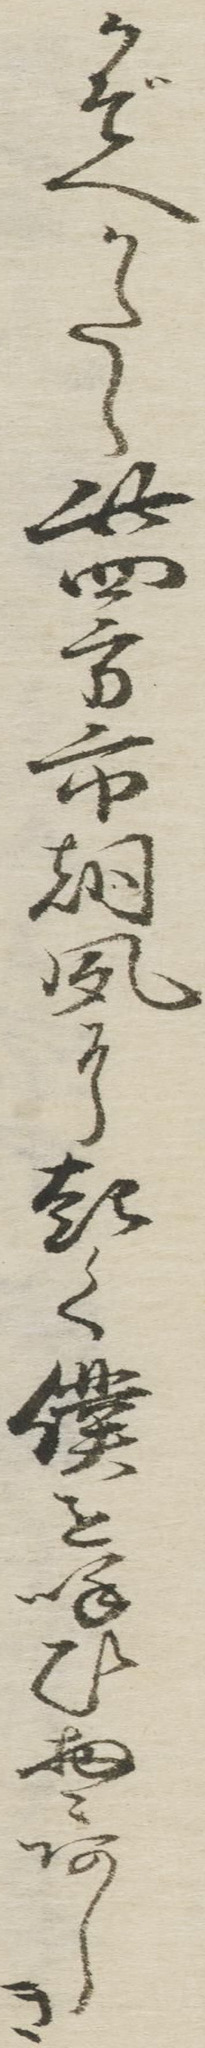かぞへかたし此四方市朝風に起て僕を呼び扨々あしき
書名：諸国大地震大津波一代記
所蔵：東京大学地震研究所図書室 Earthquake Research Institute Library, The University of Tokyo, JAPAN
